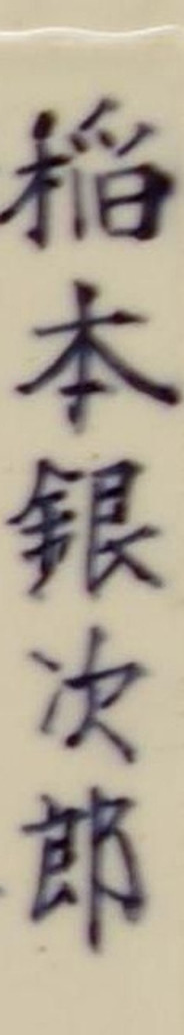稲本銀次郎
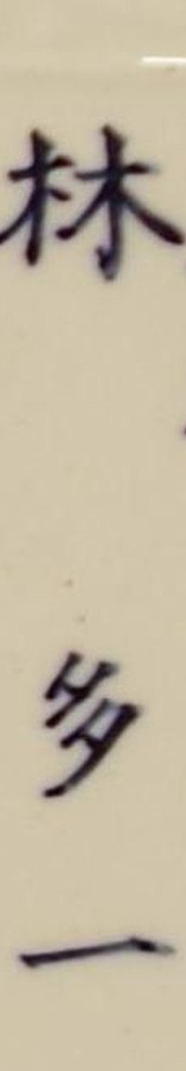林多一
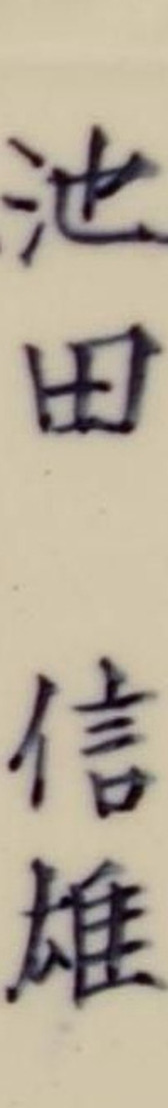池田信雄
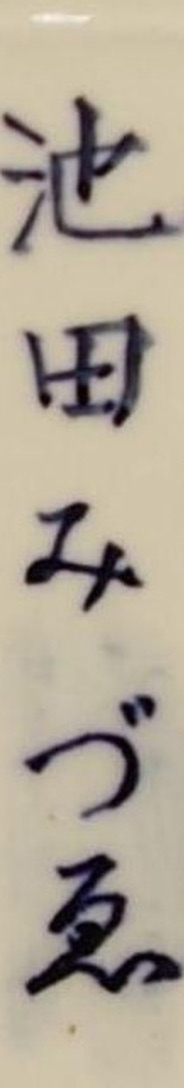池田みづゑ
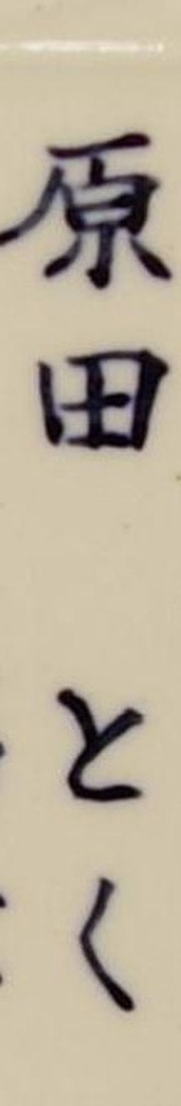原田とく
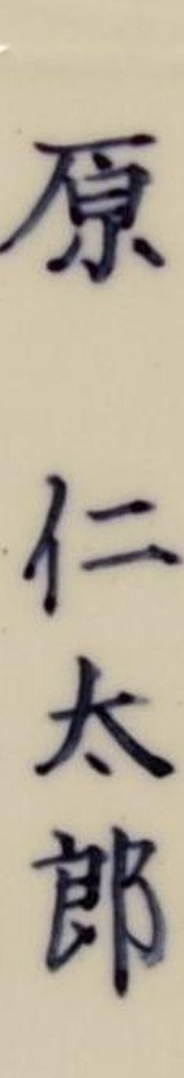原仁太郎
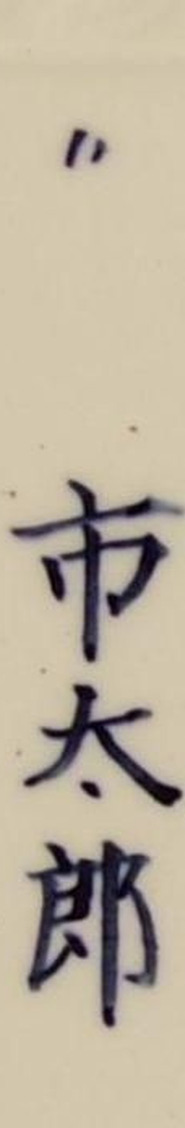市太郎
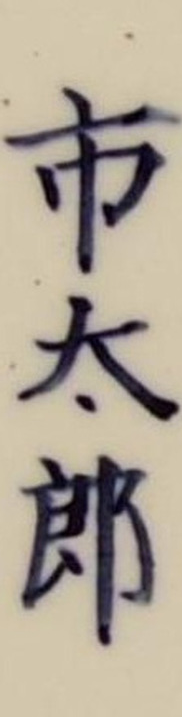市太郎
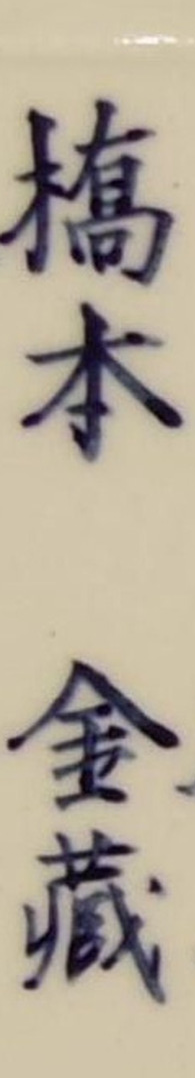橋本金蔵
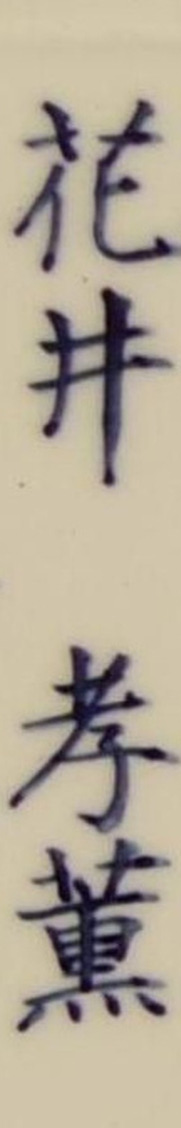花井孝薫
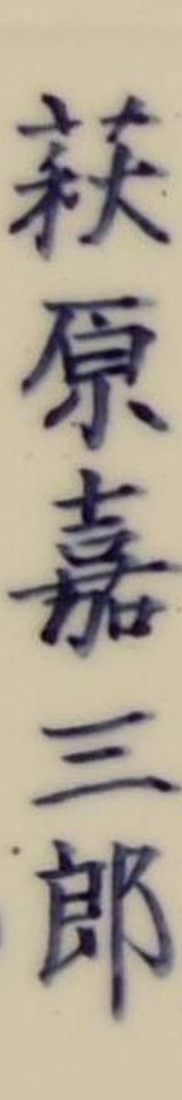萩原嘉三郎
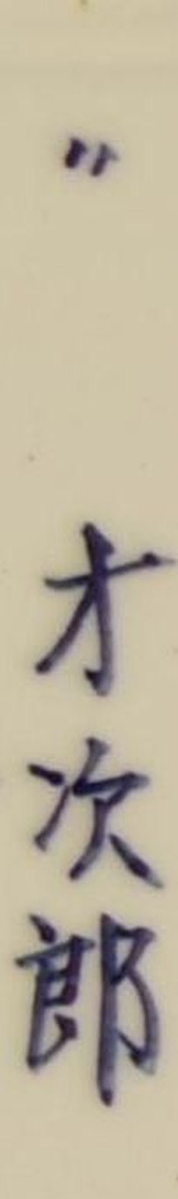才次郎
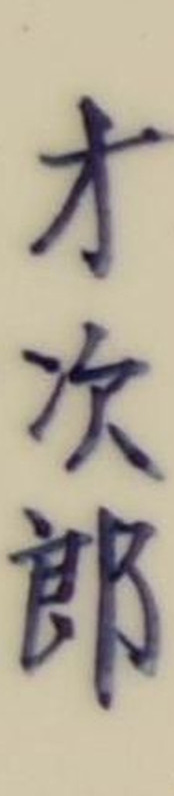才次郎

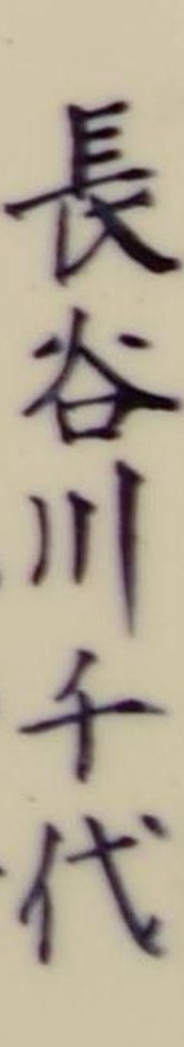長谷川千代
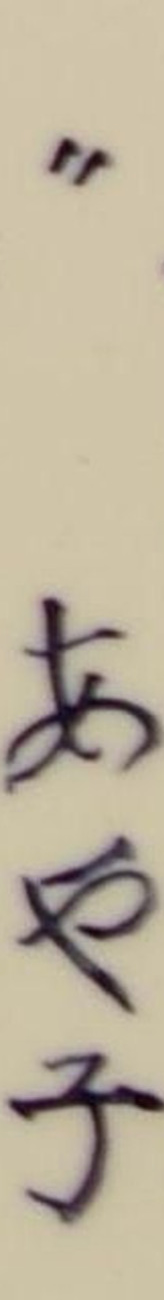あや子
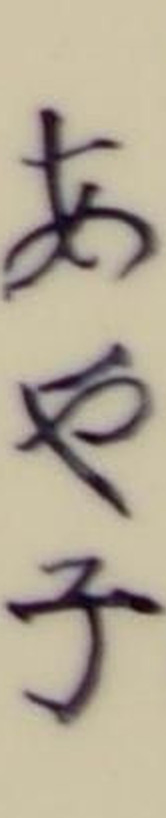あや子
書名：E~L
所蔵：高野山金剛峯寺
